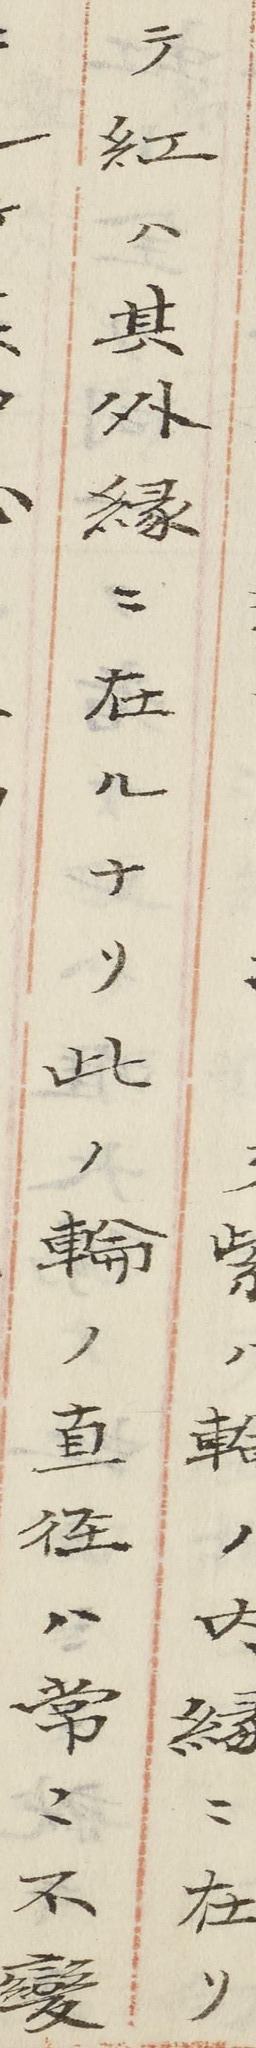テ虹ハ其外縁ニ在ルナリ此ノ輪ノ直径ハ常ニ不変
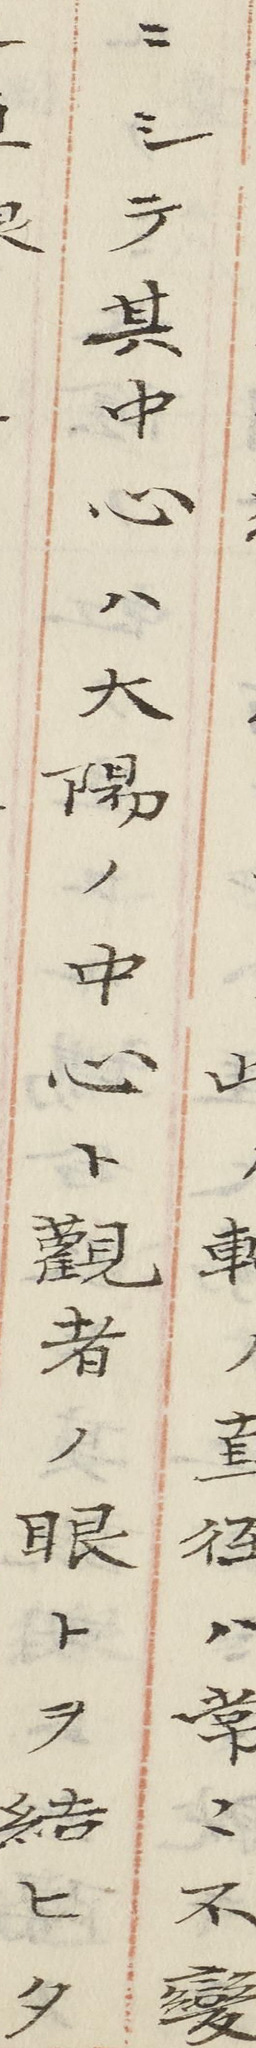ニシテ其中心ハ大陽の中心ト観者ノ眼トヲ結ヒタ
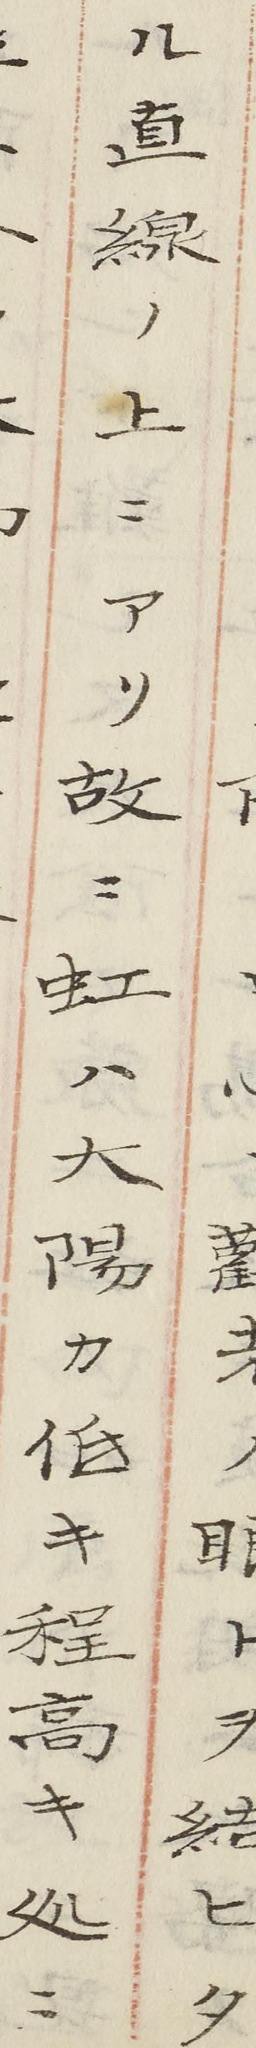ル直線ノ上ニアリ故ニ虹ハ大陽カ低キ程高キ処ニ
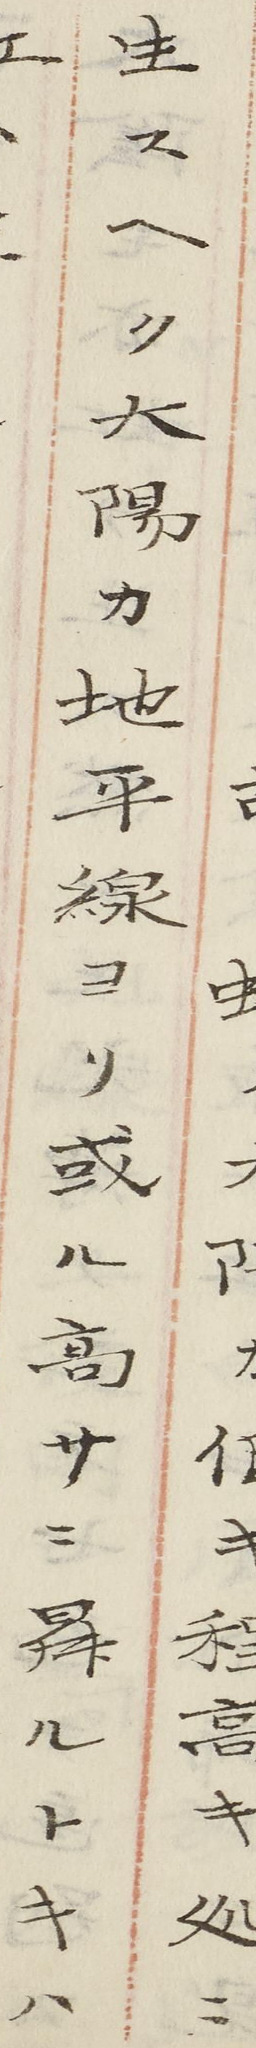生スヘク大陽カ地平線ヨリ或ル高サニ昇ルトキハ
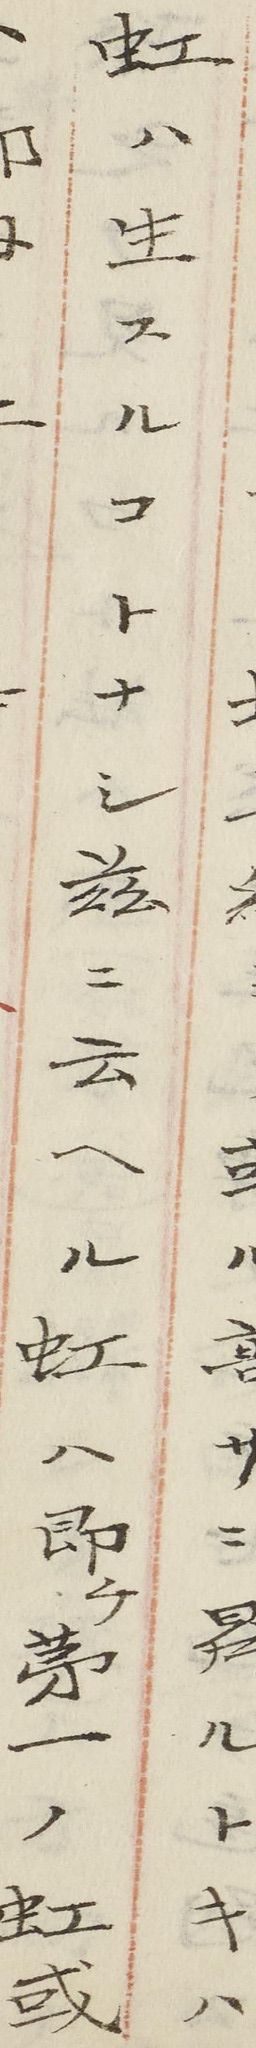虹ハ生スルコトナシ茲ニ云ヘル虹ハ即チ第一ノ虹或
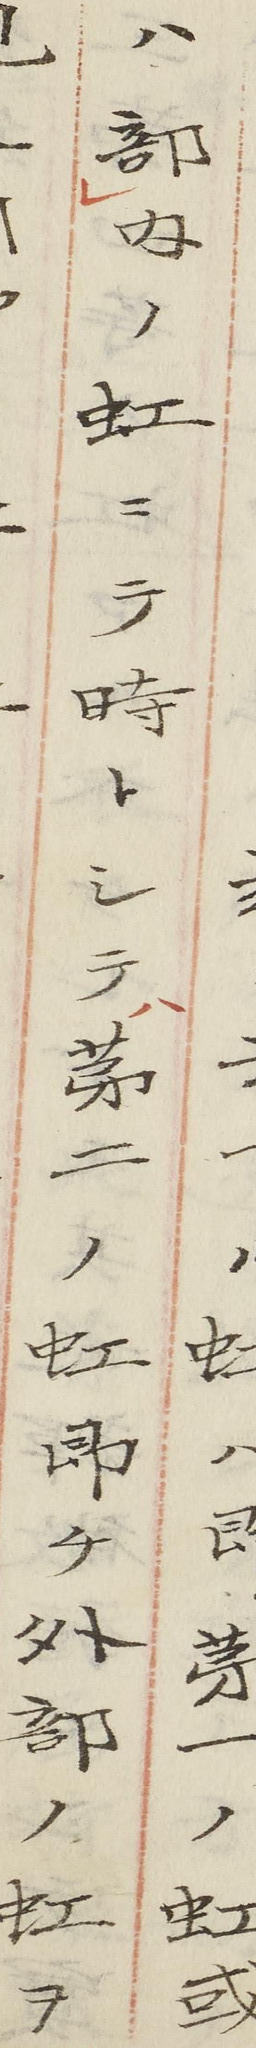ハ部内ノ虹ニテ時トシテハ第二ノ虹即チ外部ノ虹ヲ
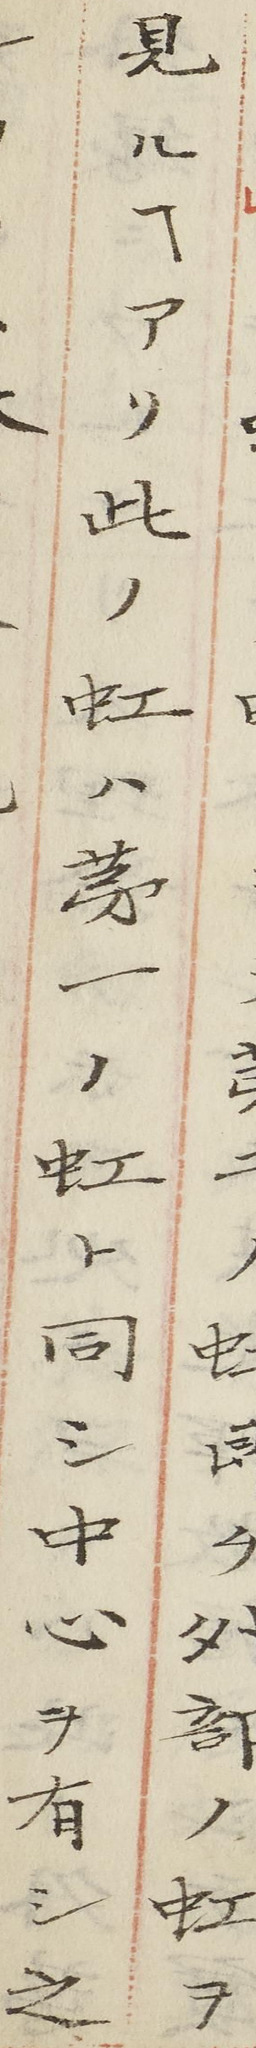見ルコトアリ此ノ虹ハ第一ノ虹ト同シ中心ヲ有シ之
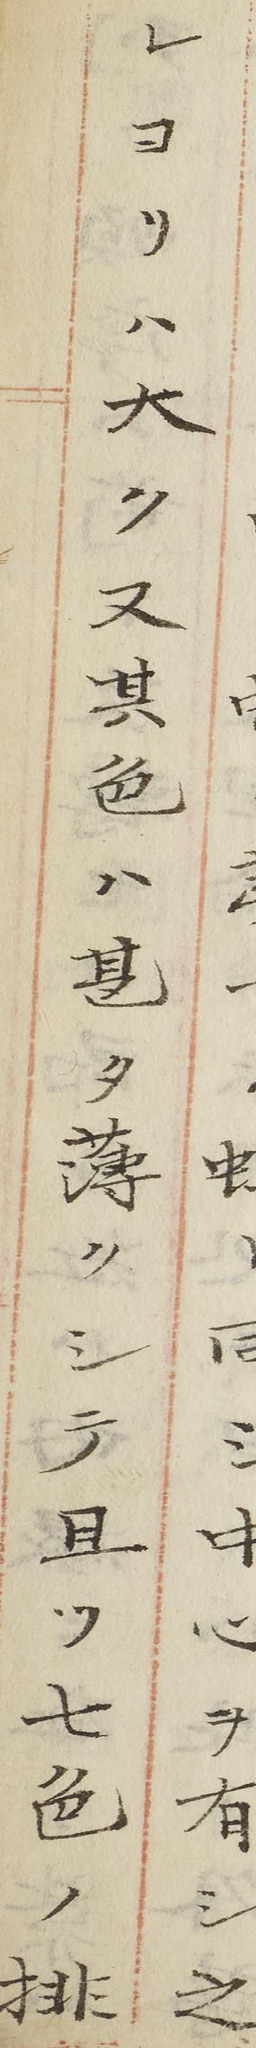レヨリハ大ク又其色ハ甚タ薄クシテ且ツ七色ノ排

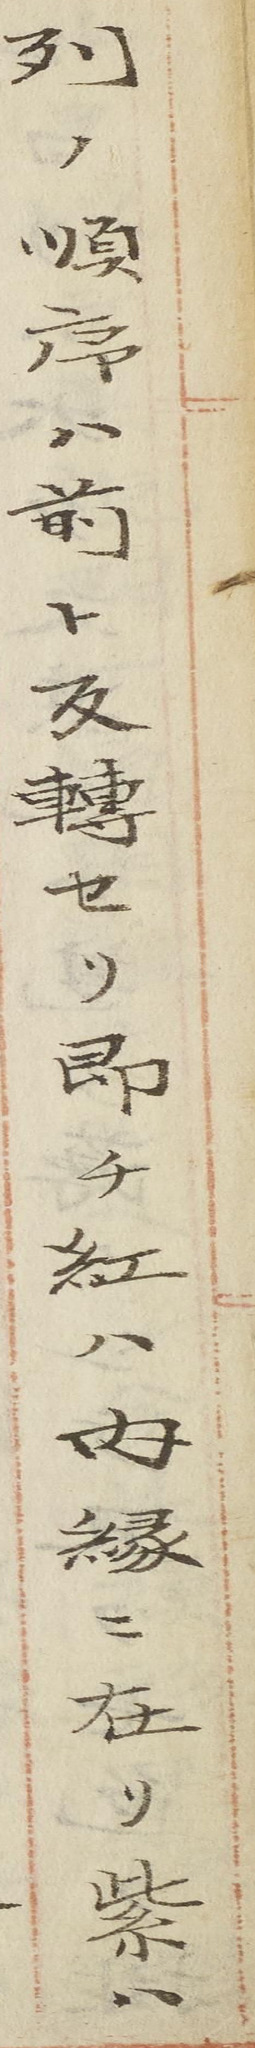列ノ順序ハ前ト反転セリ即チ紅ハ内縁ニ在リ紫ハ
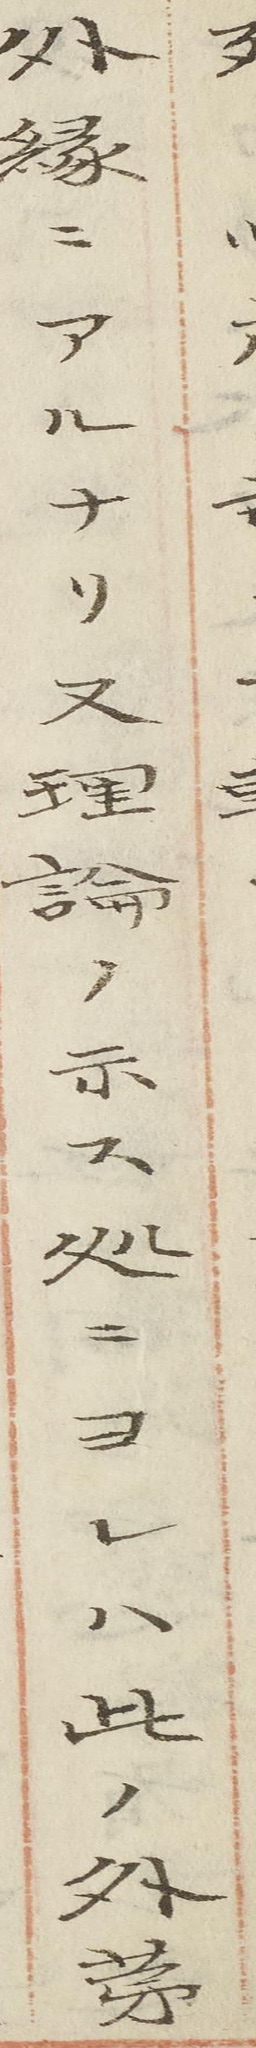外縁ニアルナリ又理論ノ示ス処ニヨレハ此ノ外第
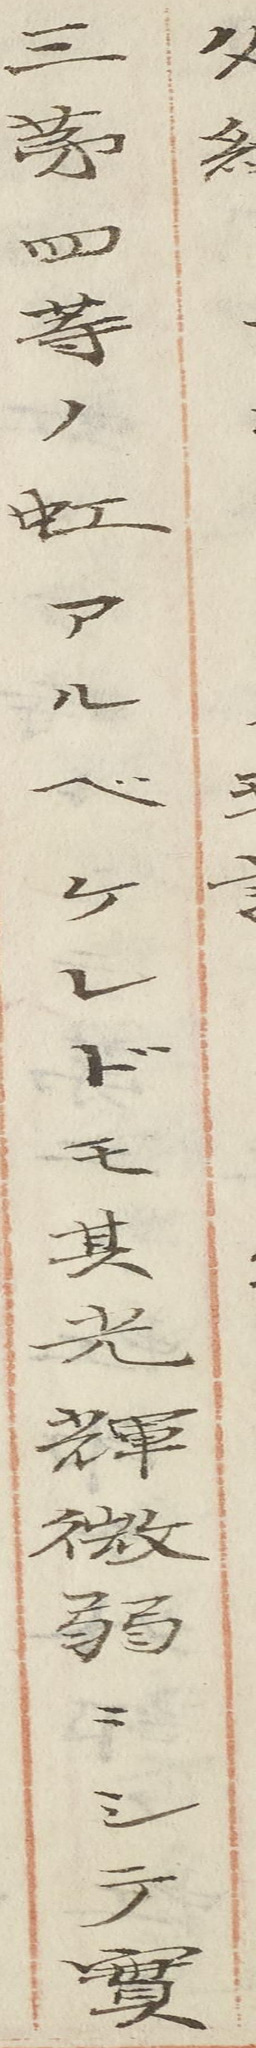三第四等ノ虹アルベケレドモ其光輝微弱ニシテ実
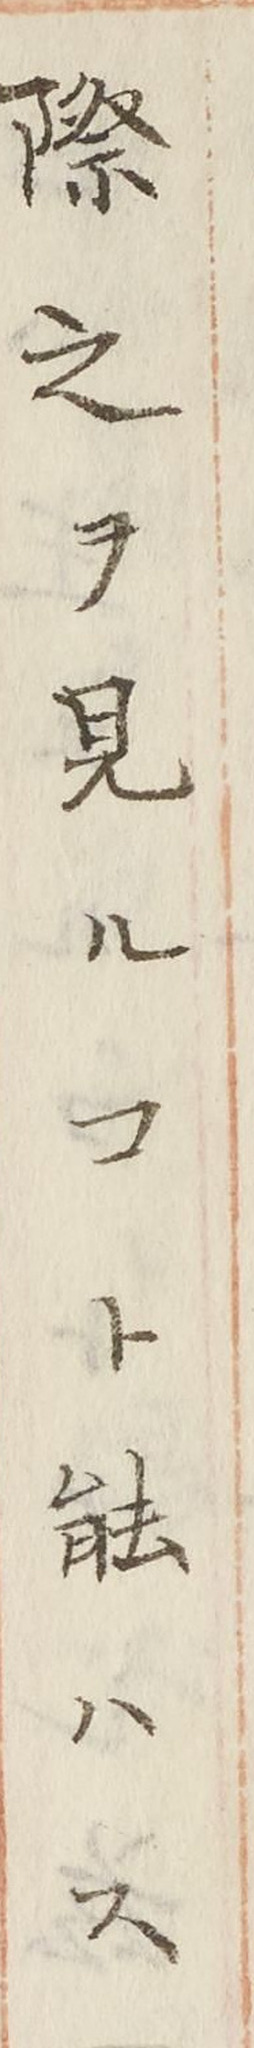際之ヲ見ルコト能ハス
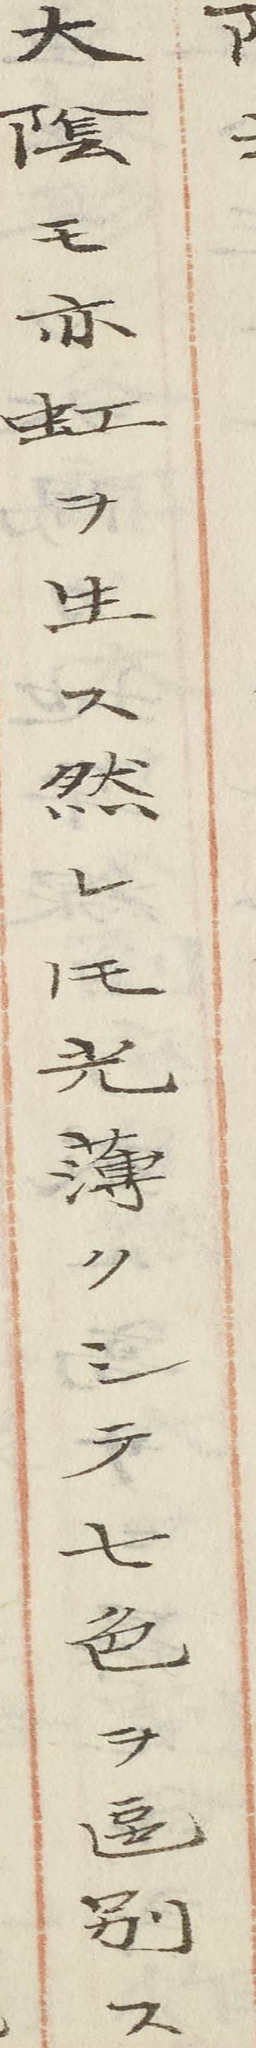大陰モ亦虹ヲ生ス然レトモ光薄クシテ七色ヲ区別ス
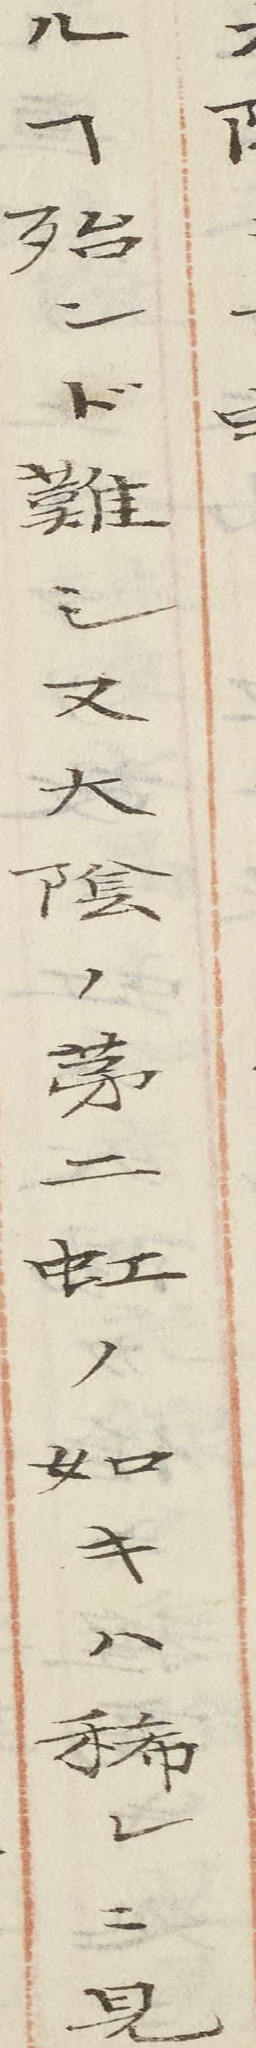ルコト殆ンド難シ又大陰ノ第二虹ノ如キハ稀レニ見
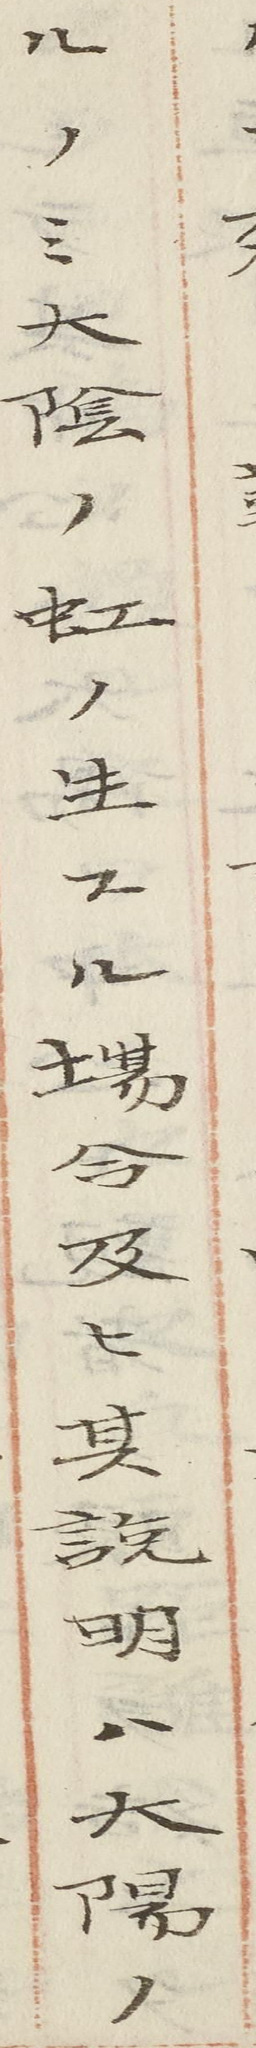ルノミ大陰ノ虹ノ生スル場合及ヒ其説明ハ大陽ノ
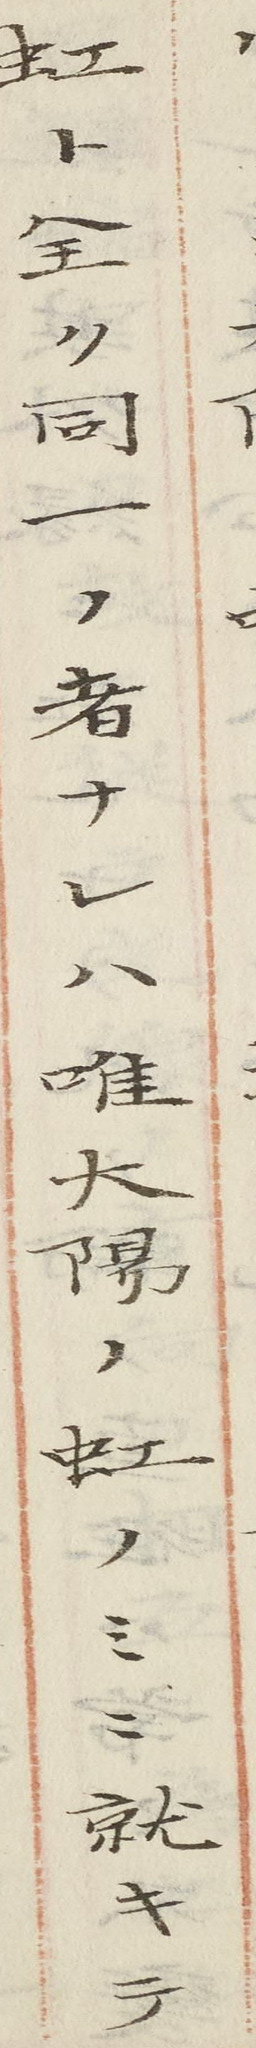虹ト全ク同一ノ者ナレハ唯大陽ノ虹ノミニ就キテ
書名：虹及ハロノ説明
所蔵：東京大学地震研究所図書室 Earthquake Research Institute Library, The University of Tokyo, JAPAN
